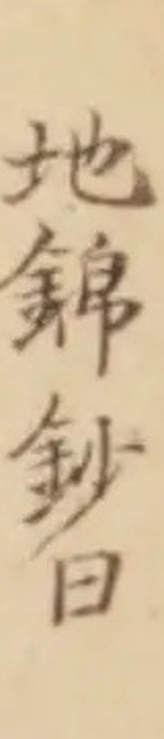地錦鈔曰
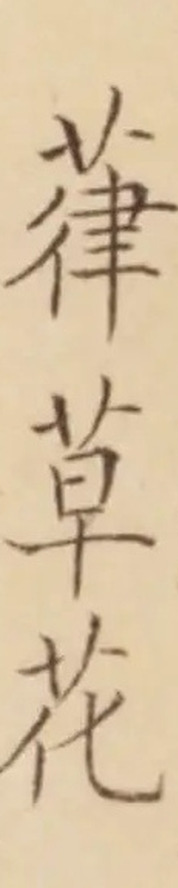葎草花
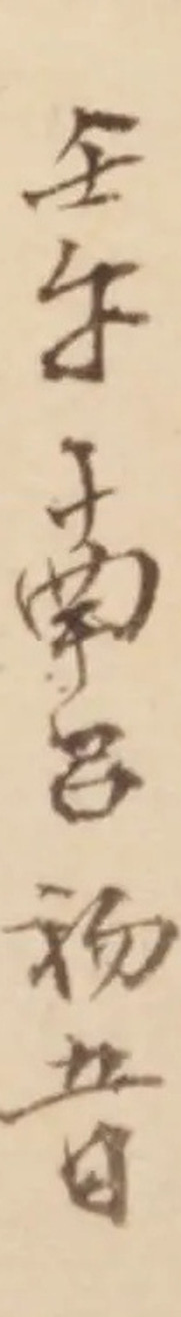壬午南呂五日
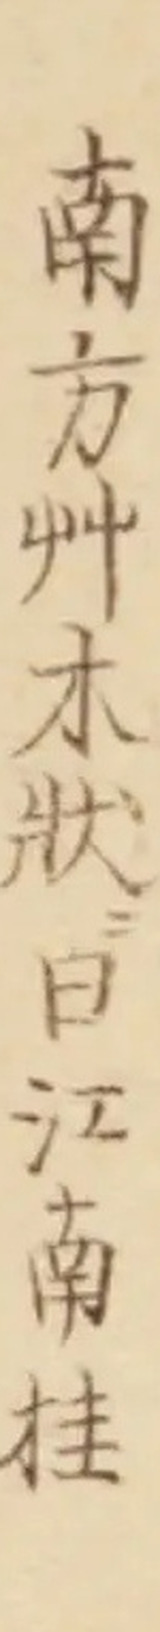南方艸木状曰江南桂
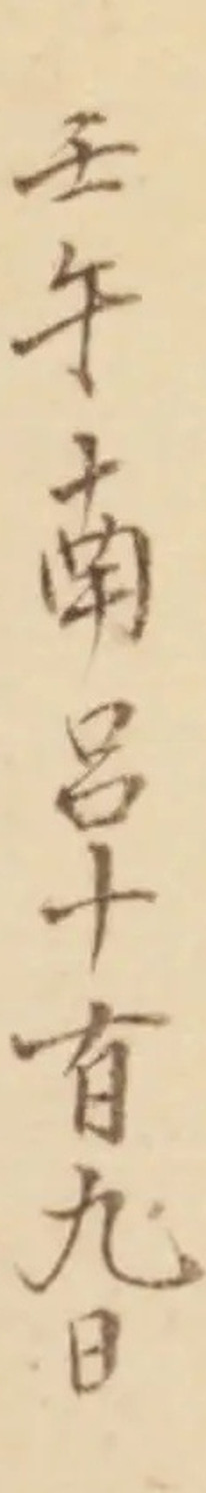壬午南呂十有九日
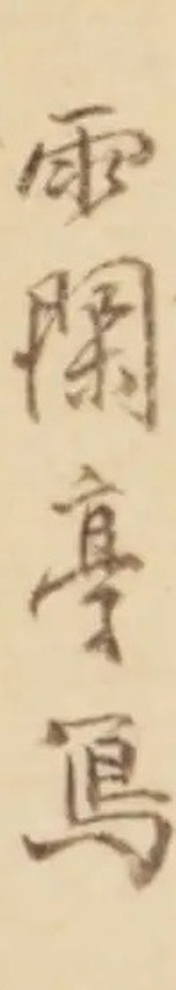雨閑亭写

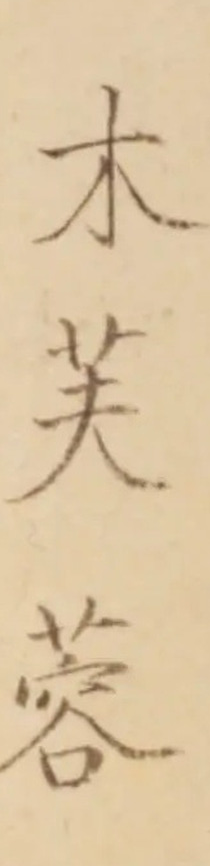木芙蓉
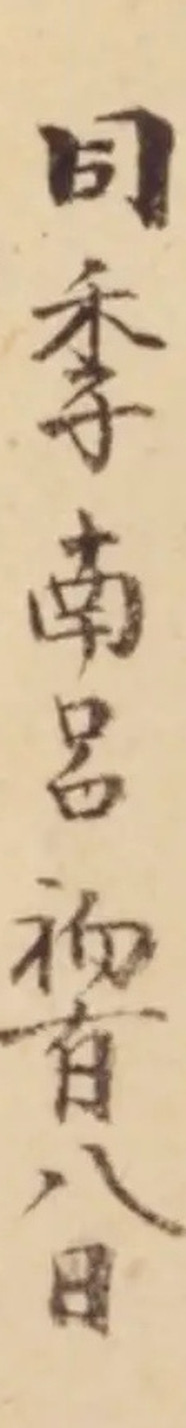同季南呂有八日
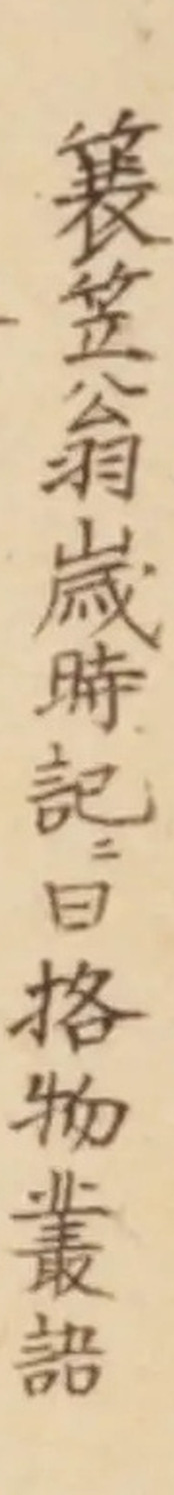蓑笠翁歳時記曰格物叢語
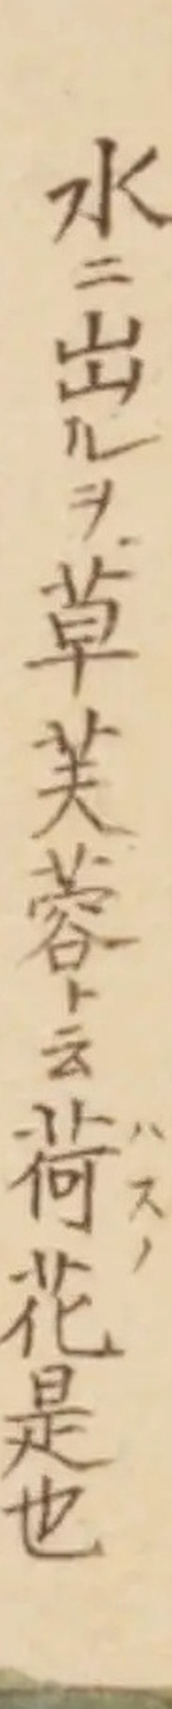水ニ出ルヲ草芙蓉云荷花是也
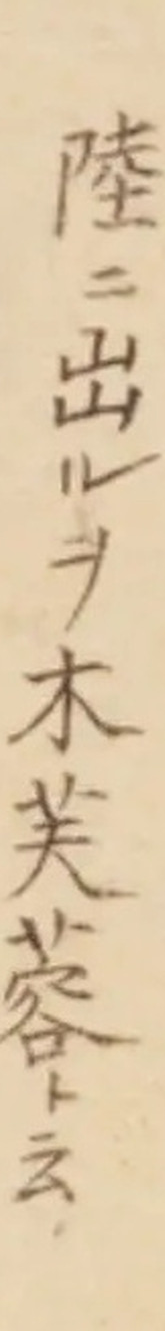陸ニ出ルヲ木芙蓉云
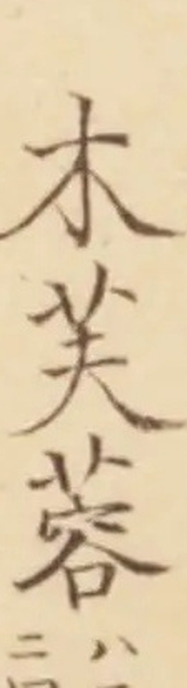木芙蓉
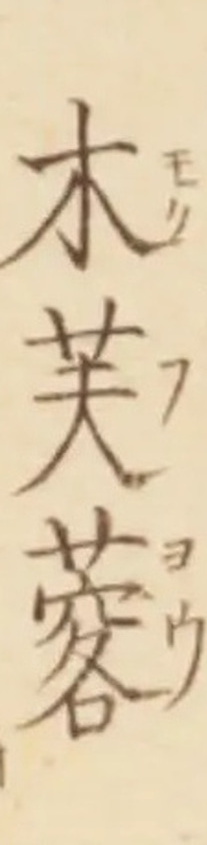木芙蓉
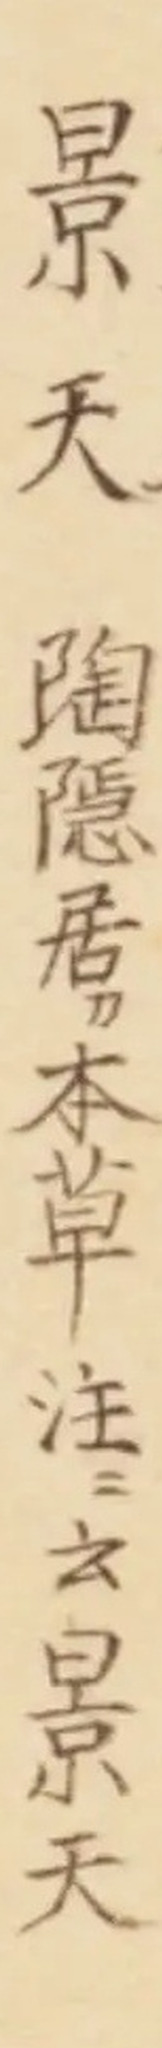景天陶隠居本草注云景天
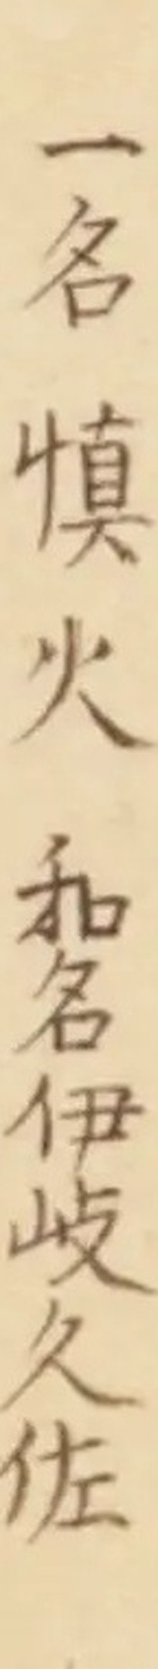一名慎火和名伊岐久佐
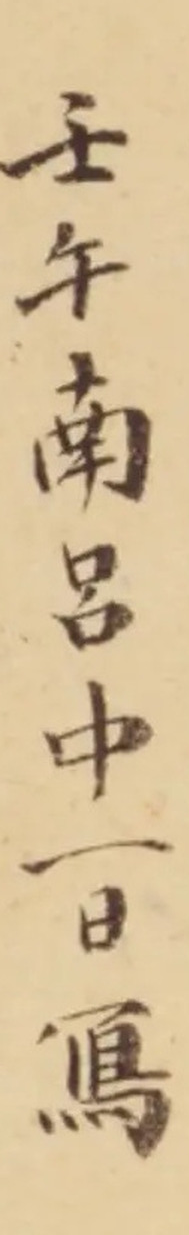壬午南呂中一日写
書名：梅園草木花譜秋之部. 1
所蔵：国立国会図書館 National Diet Library, JAPAN
